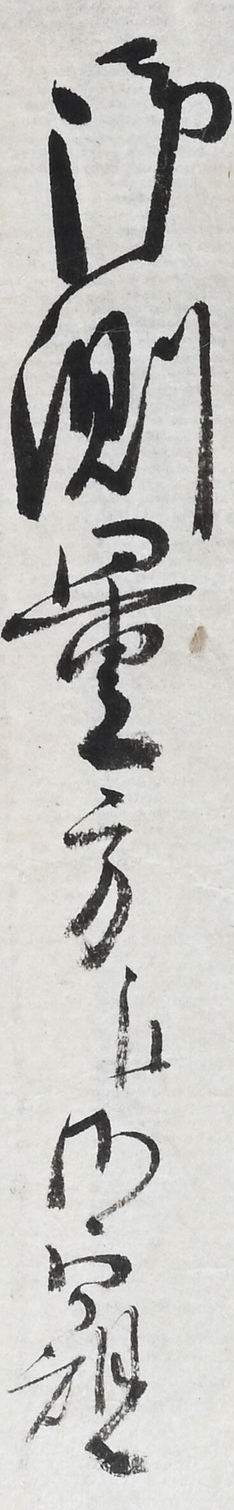御測量方え御窺
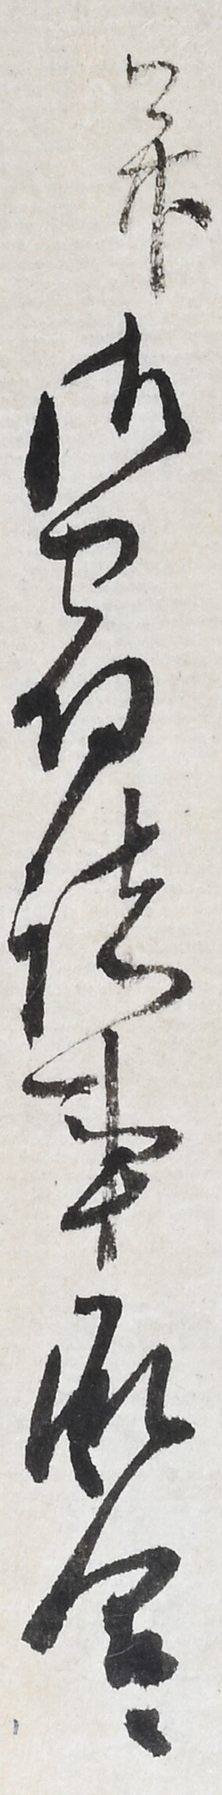幷御宿諸事承合ニ
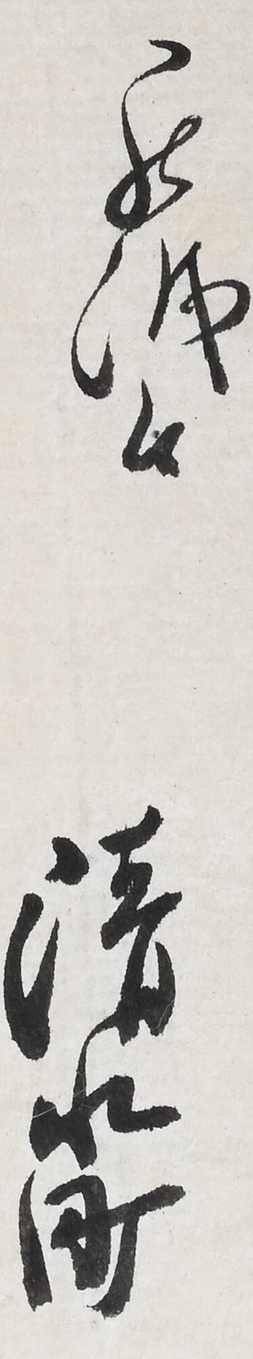罷越候清水町
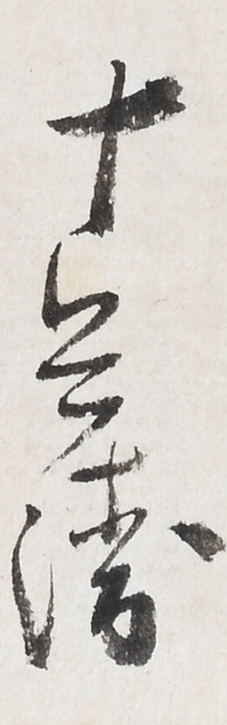十兵衛
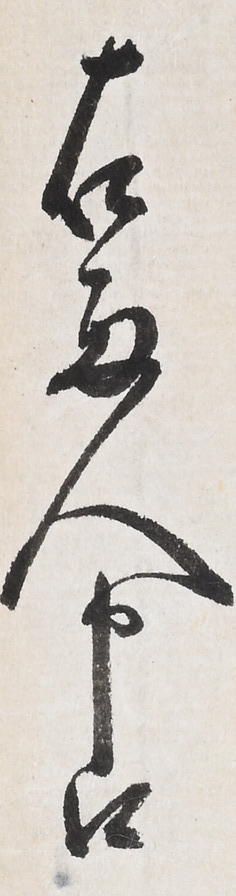右両人中え
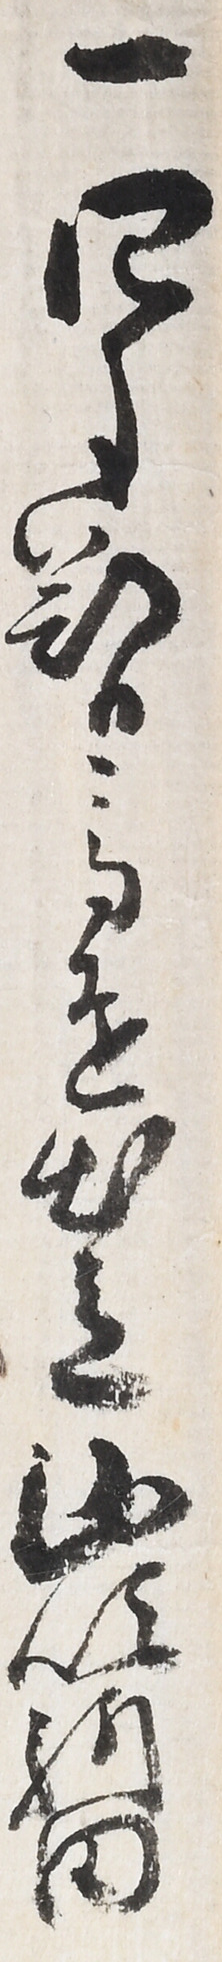一四月朔日高遠出立山吹新田
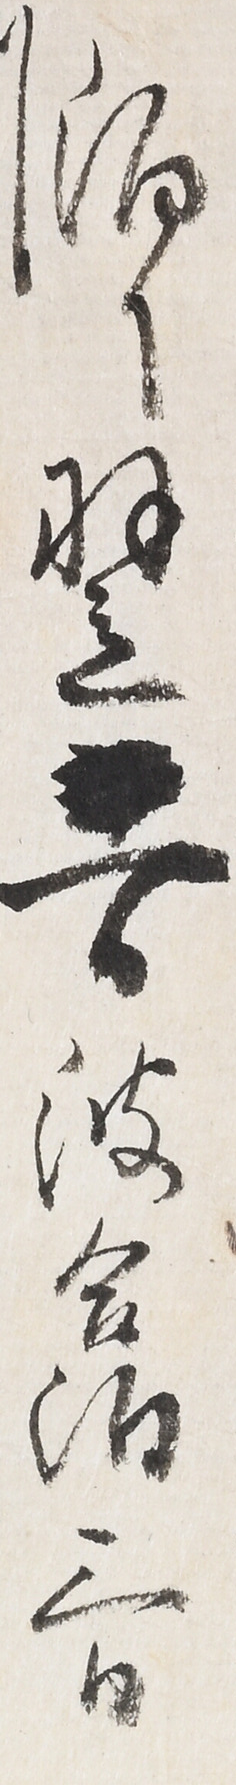泊り翌二日波合泊三日
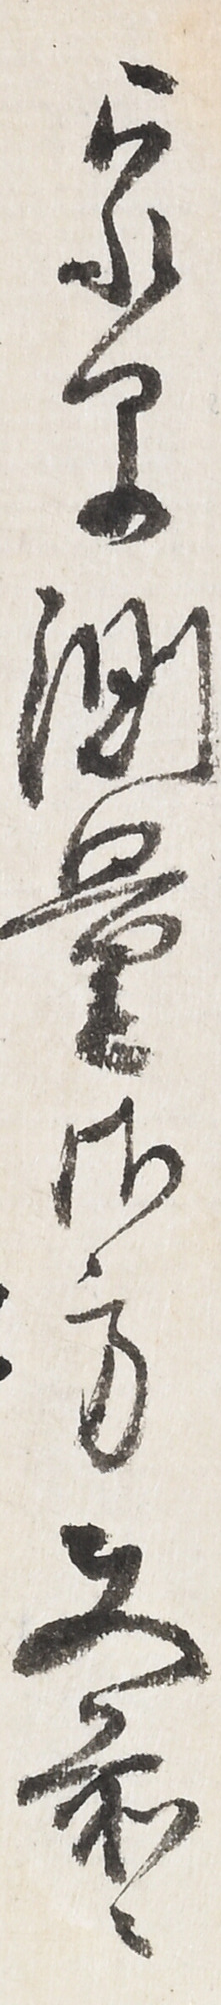最早測量御方夫前ニ
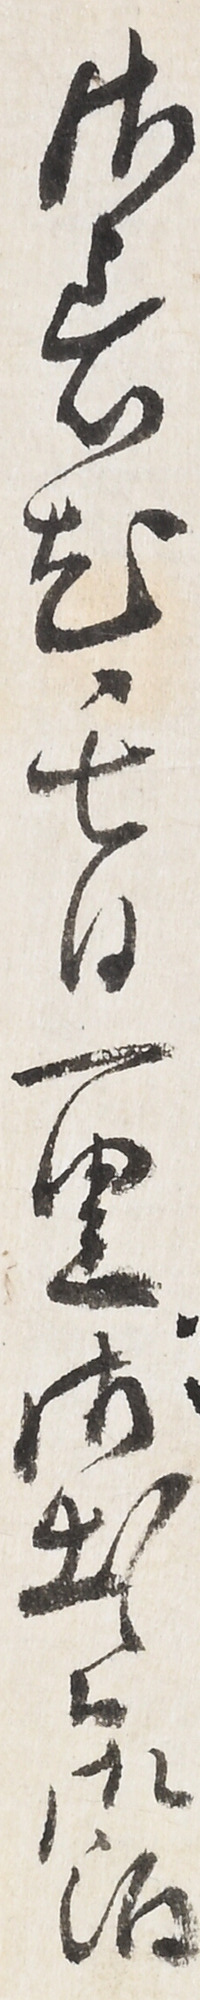御着尤其日一里半御出候而御泊
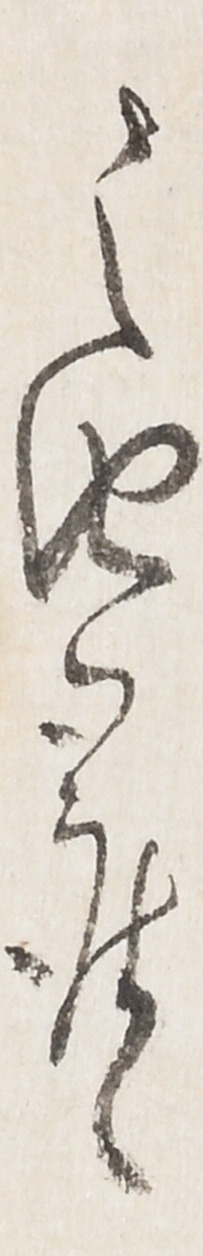之由御座候
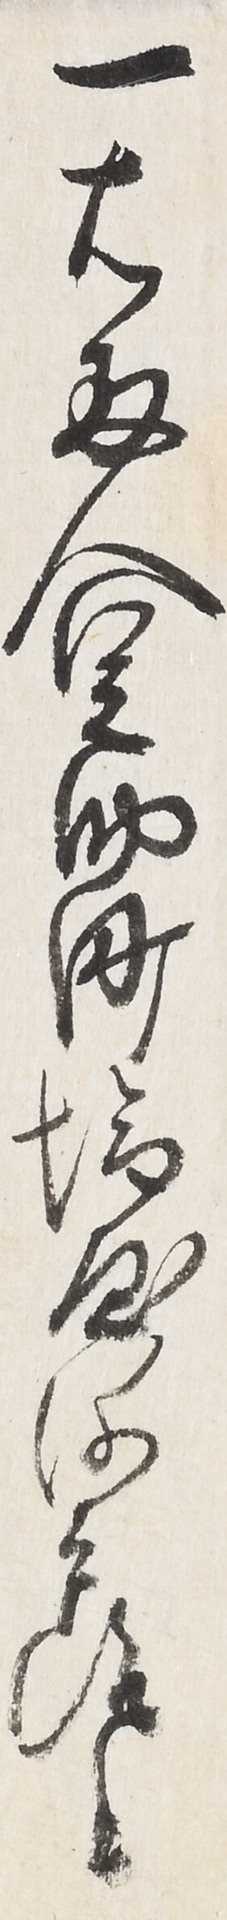一右両人足助町塩屋弥平治と
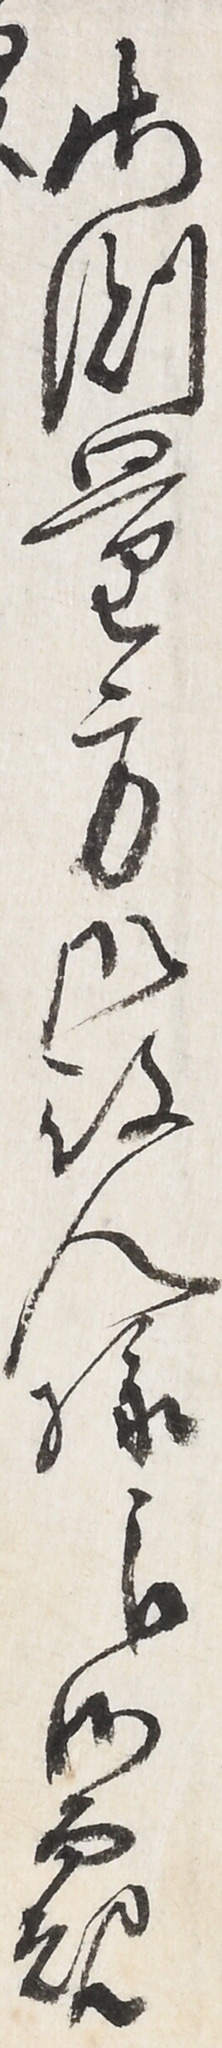御測量方御役人様え御窺

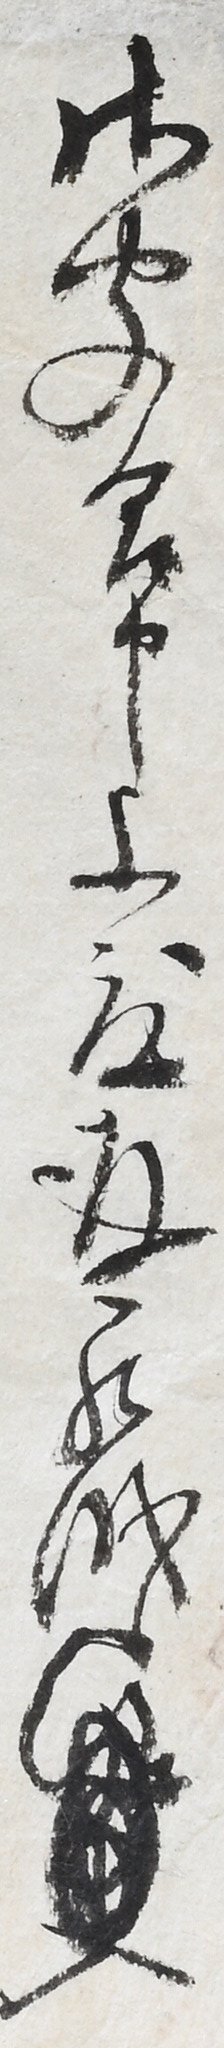御聞合申上度奉存罷越候
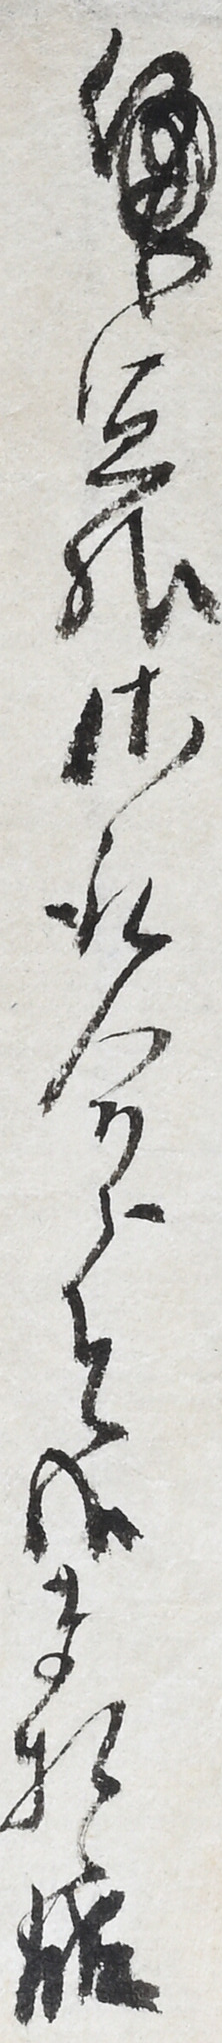宜様御取合被下候様奉願候段
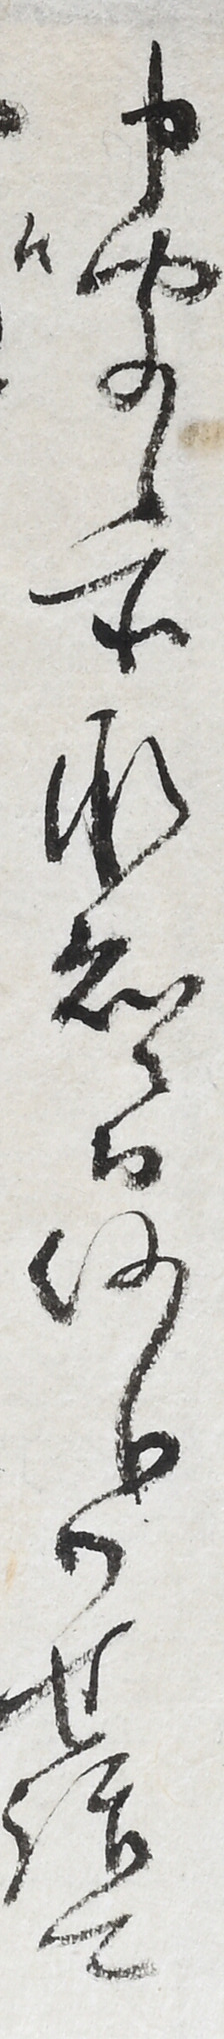申聞候所承知ニ而何分御世話可
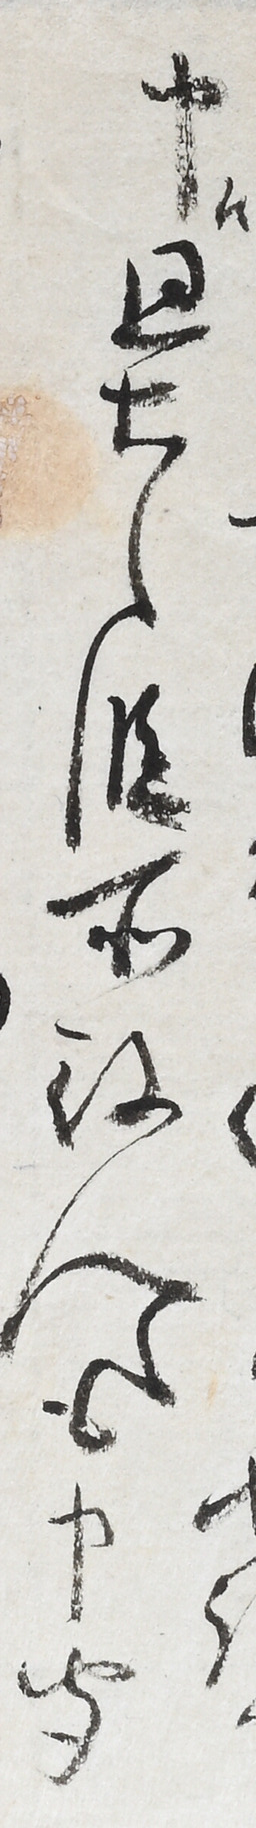申候且右之段所役人へも申聞
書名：（覚書）
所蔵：伊那市立高遠町図書館・合同会社AMANE
